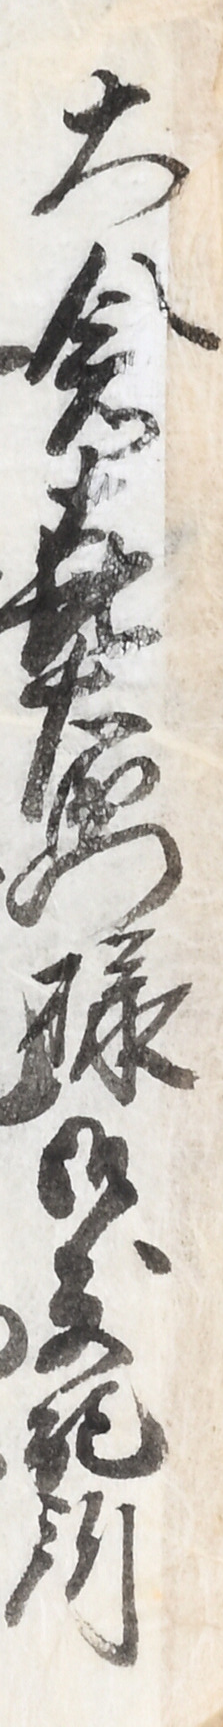大倉喜右衛門様御支配所
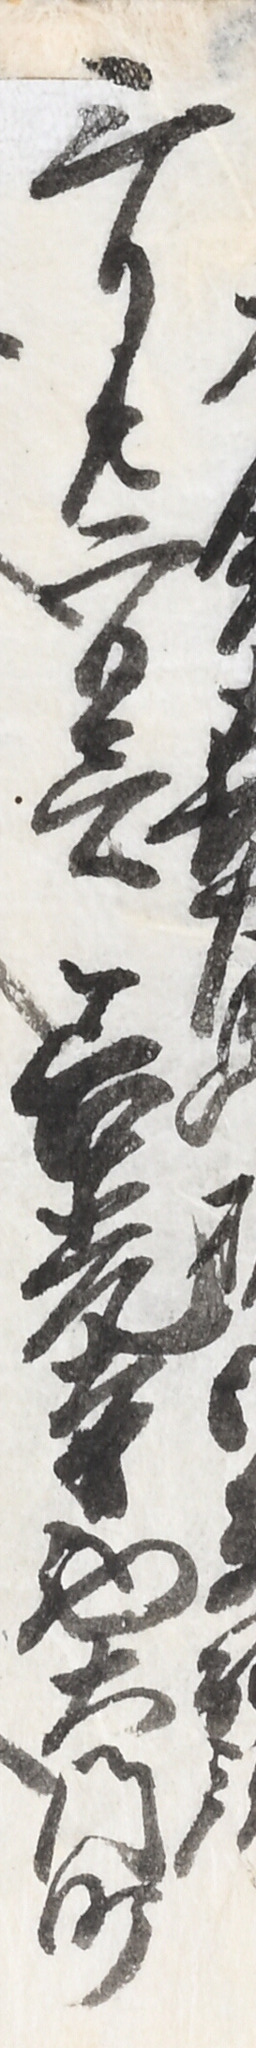三月廿二日着善光寺西大門町
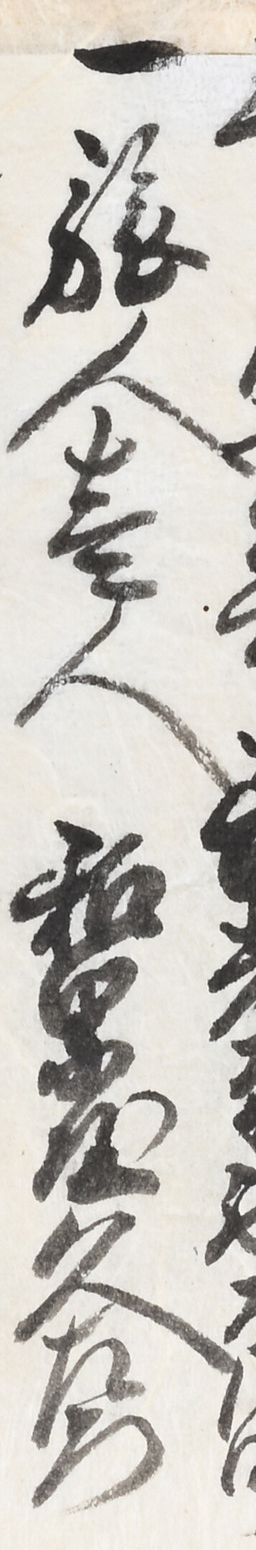一旅人壱人和泉屋久左衛門
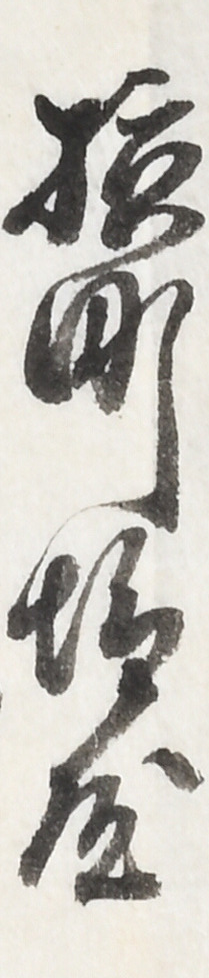横町塩屋
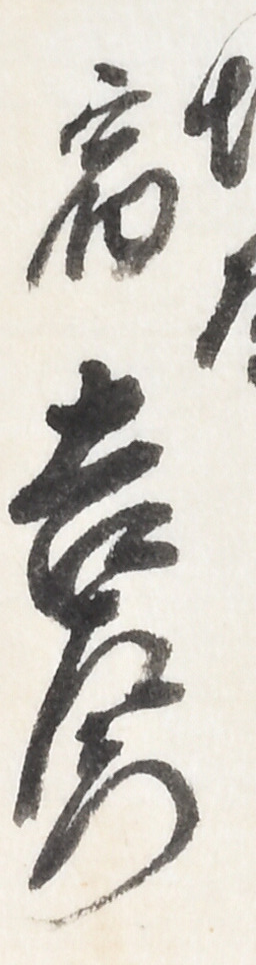宿吉左衛門
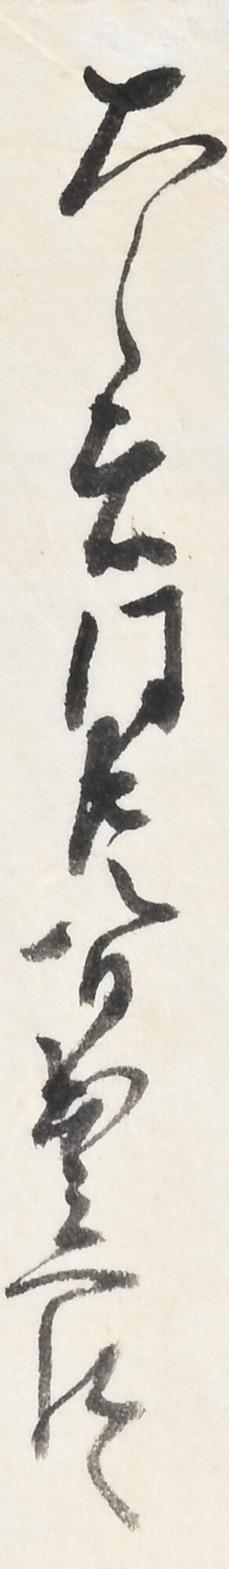右之者同廿八日出立仕候
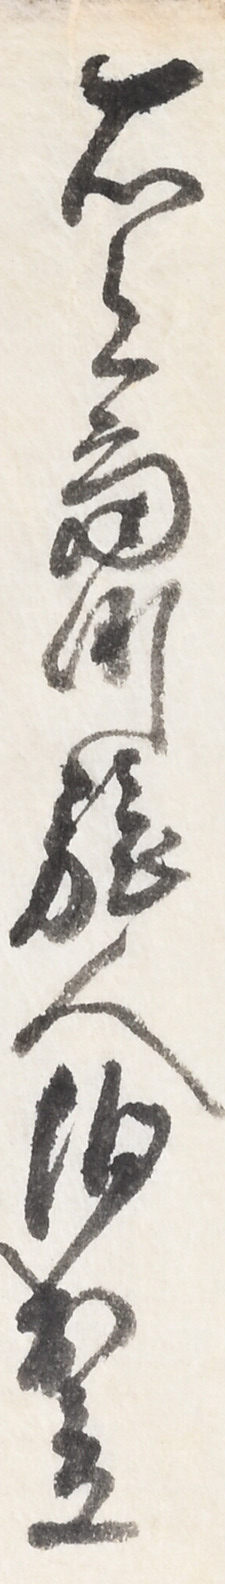右者当町旅人泊出立
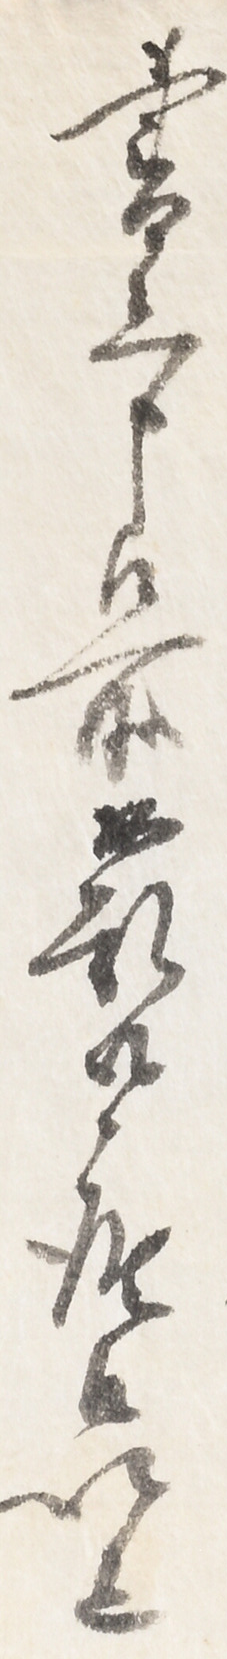書上申候所如斯御座候以上
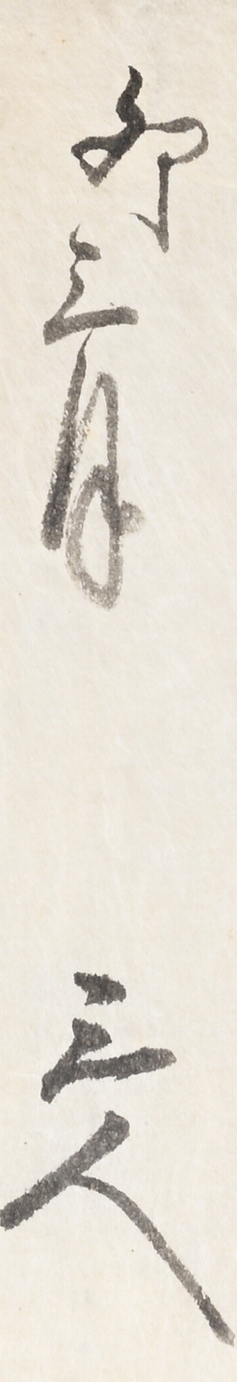卯三月三人
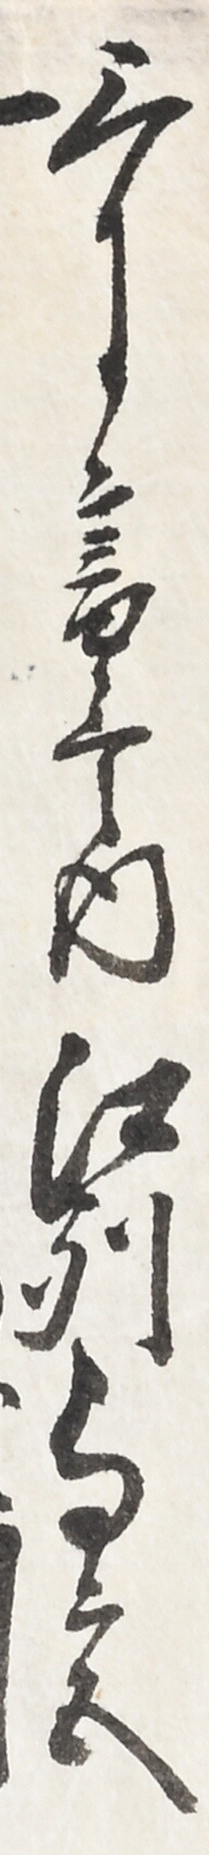三月書上之内江州高宮
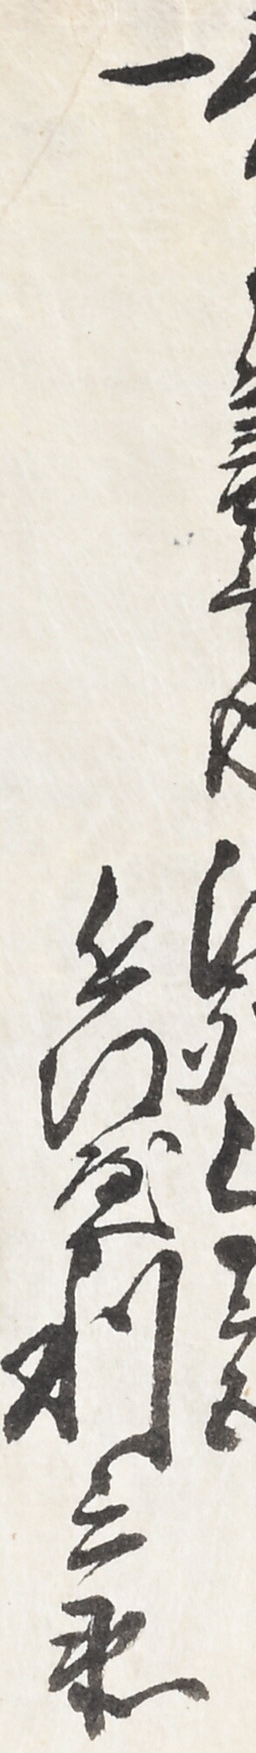一近江屋利兵衛
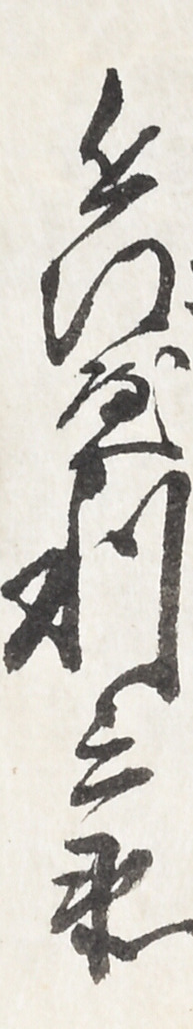一近江屋利兵衛
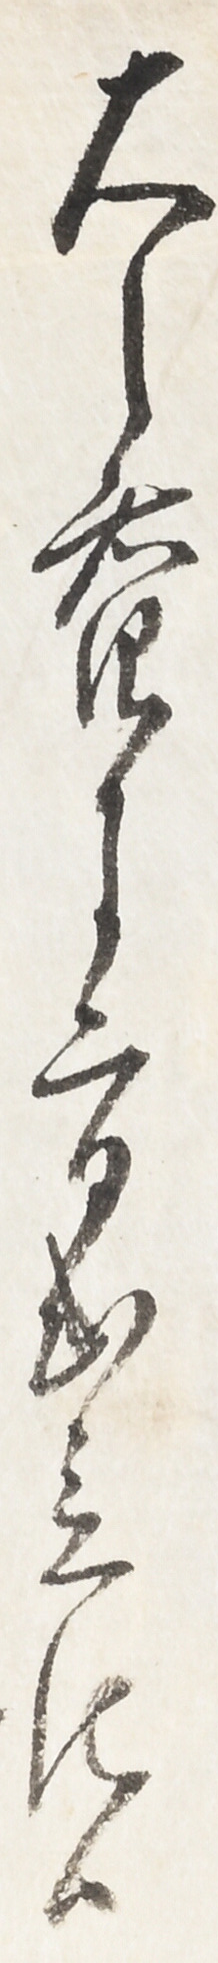右之者四月二日出立仕候
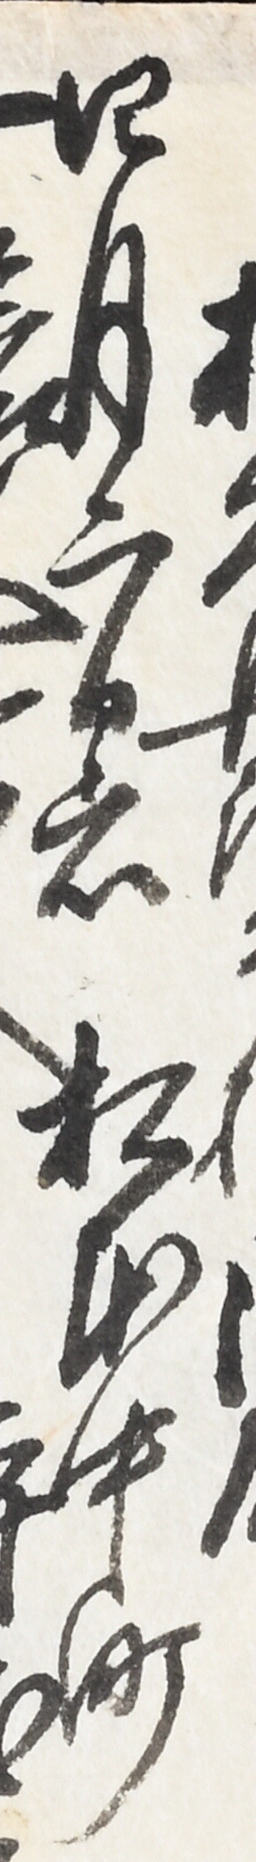四月二日着松本中町
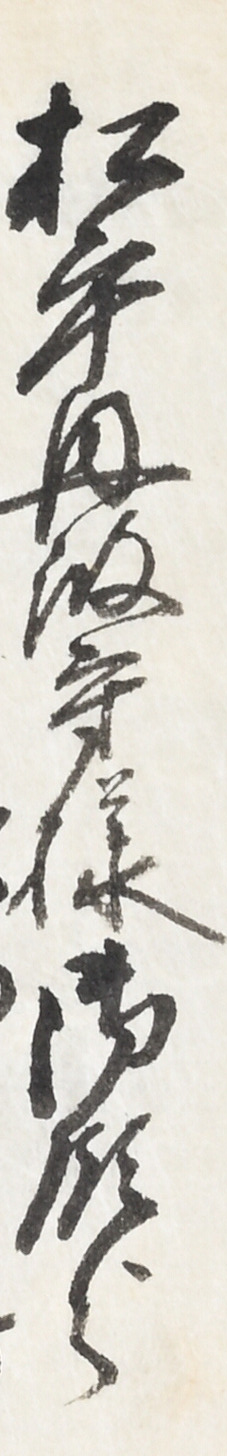松平丹波守様御領分
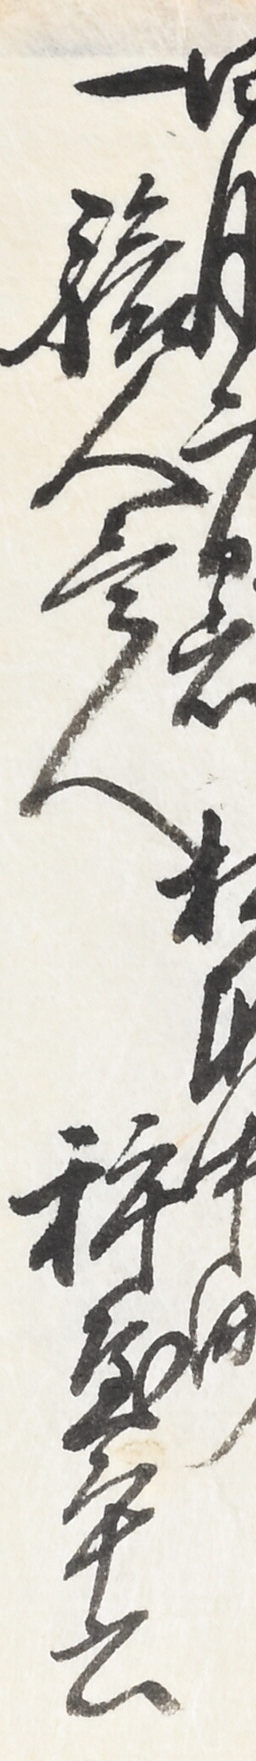一旅人壱人秤屋平六
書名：旅人泊控帳
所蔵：伊那市立高遠町図書館・合同会社AMANE
